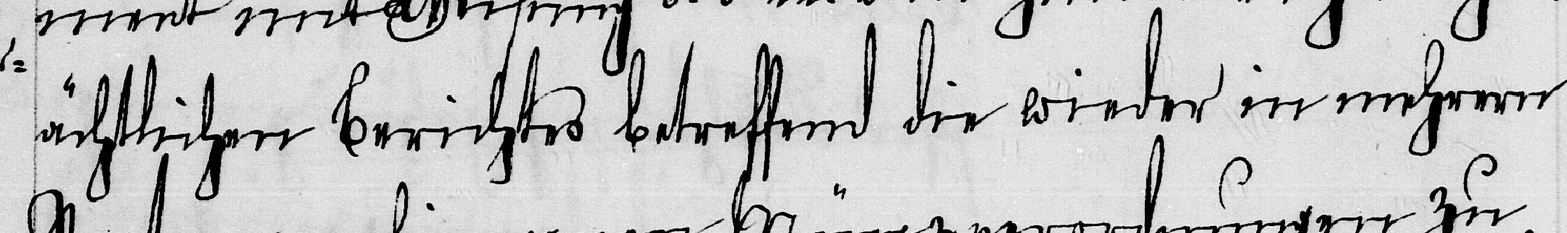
ächtlichen Berichtes betreffend die wieder in mehrern
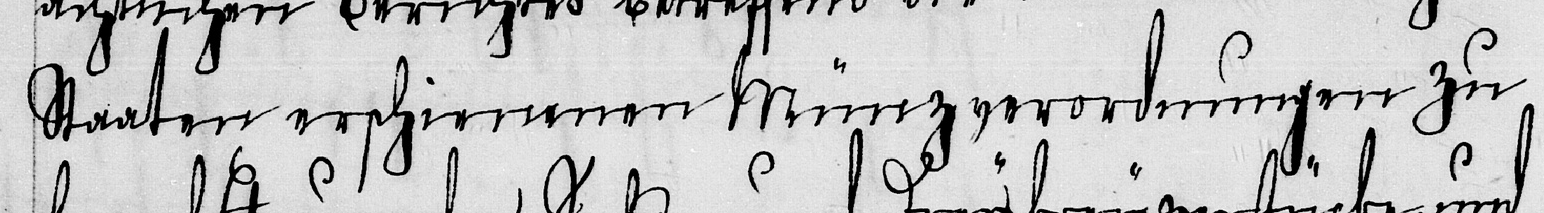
Staaten erschienenen Münzverordnungen zu
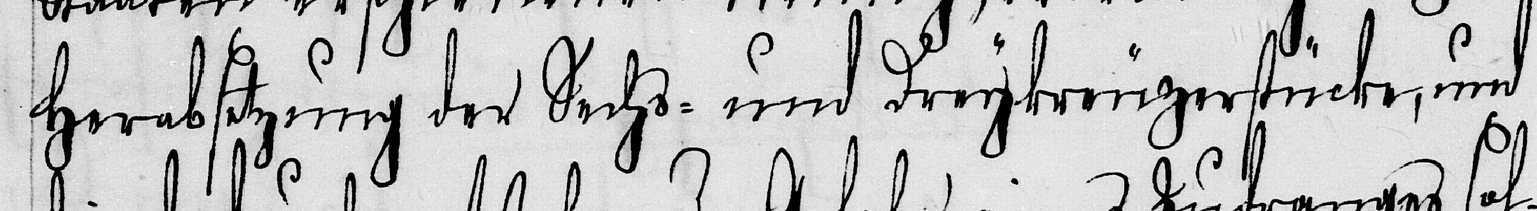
Herabsetzung der Sechs- und Dreykreuzerstücke, und
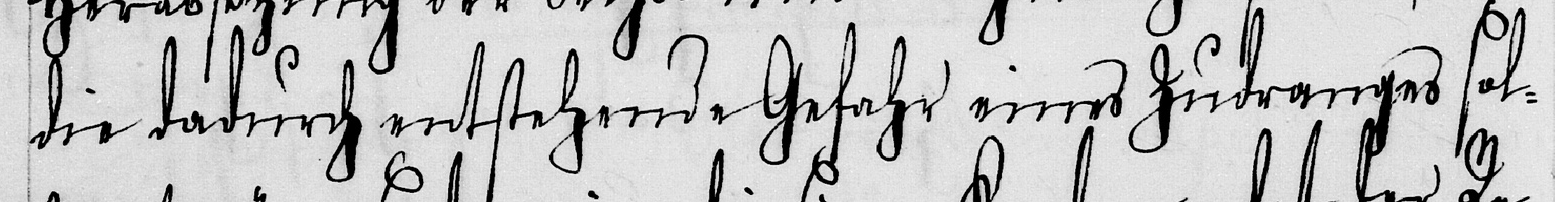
die dadurch entstehende Gefahr eines Zudranges fal¬
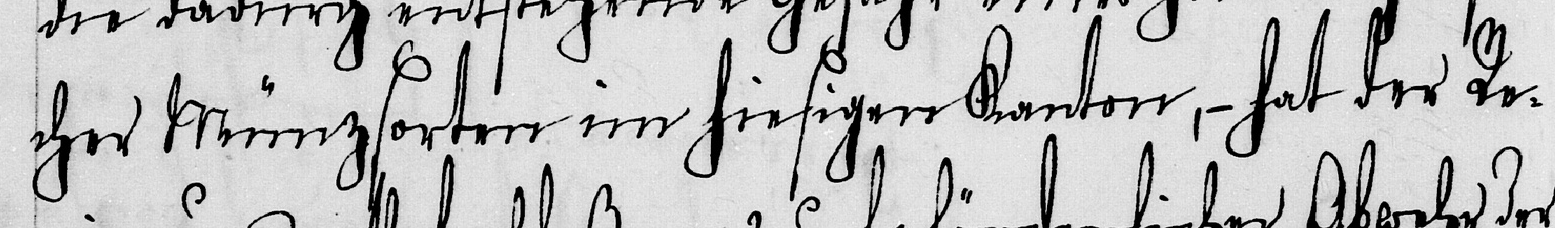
scher Münzsorten im hiesigen Kanton, – hat der Re¬
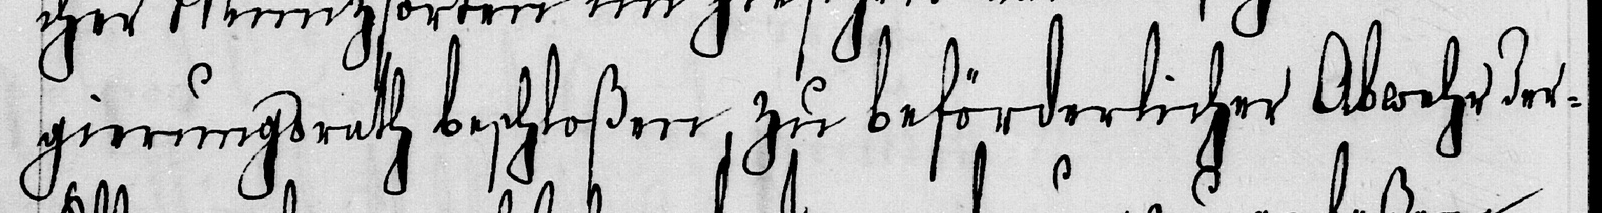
gierungsrath beschloßen, zu beförderlicher Abwehr der¬
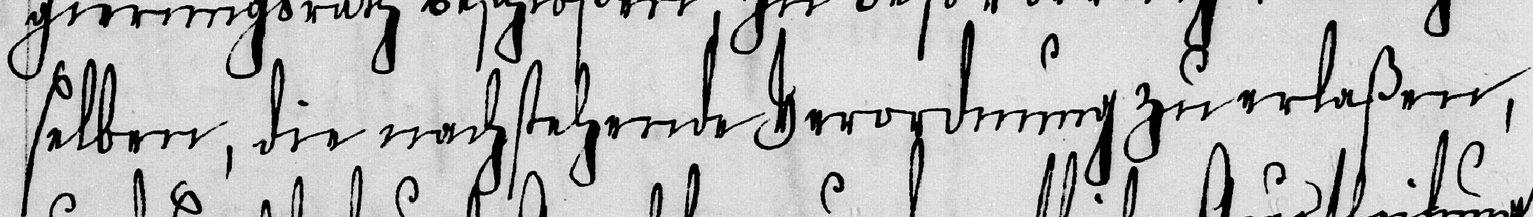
selben, die nachstehende Verordnung zu erlaßen,
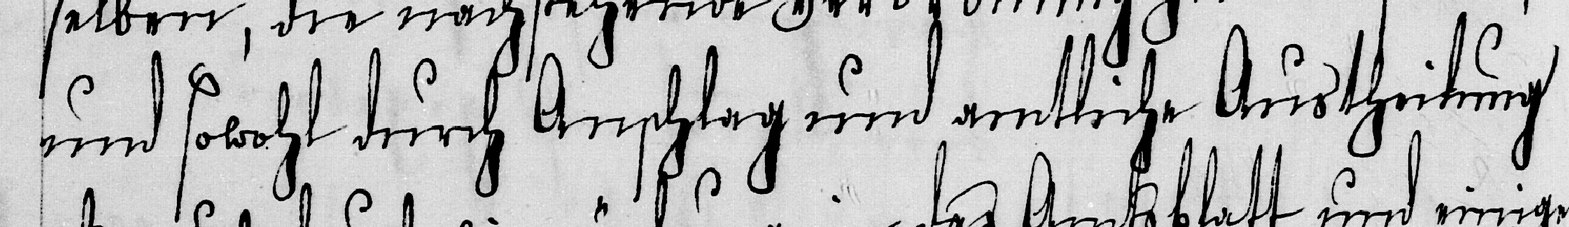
und sowohl durch Anschlag und amtliche Austheilung
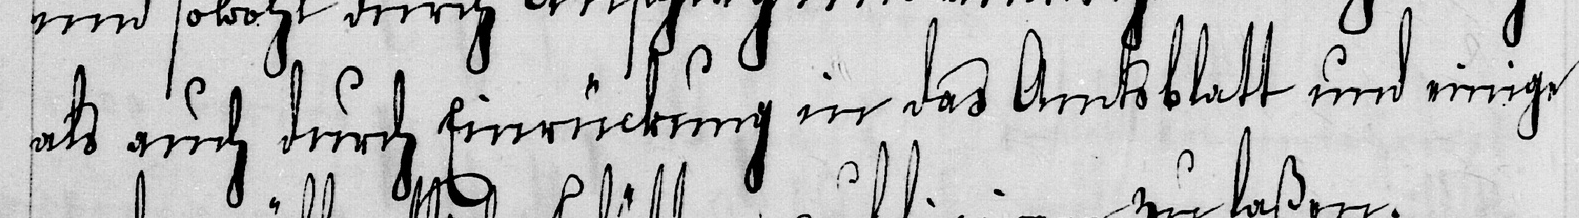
als auch durch Einrückung in das Amtsblatt und einige
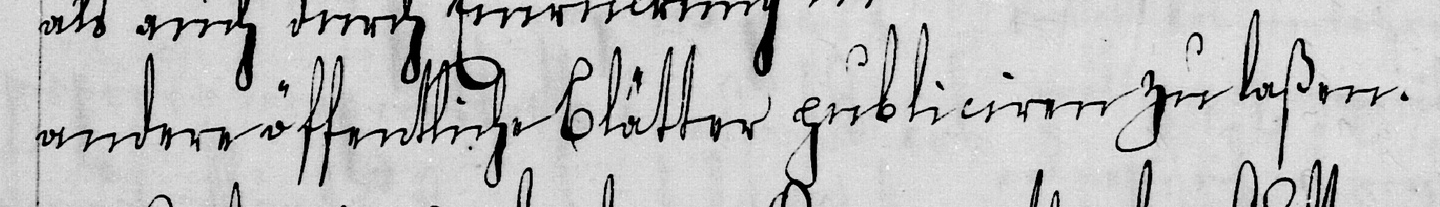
andere öffentliche Blätter publiciren zu laßen.
